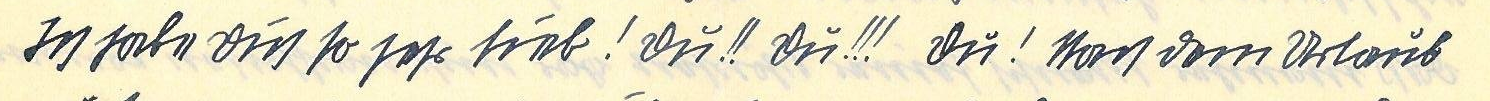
Ich habe Dich so sehr lieb! Du!! Du!!! Du! Nach dem Urlaub
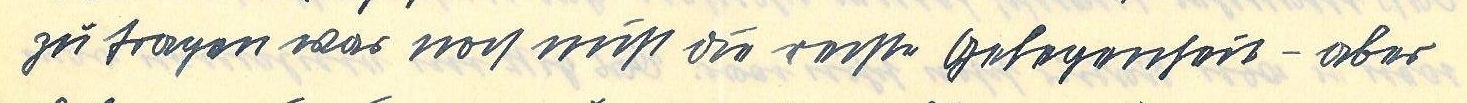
zu fragen war noch nicht die rechte Gelegenheit – aber
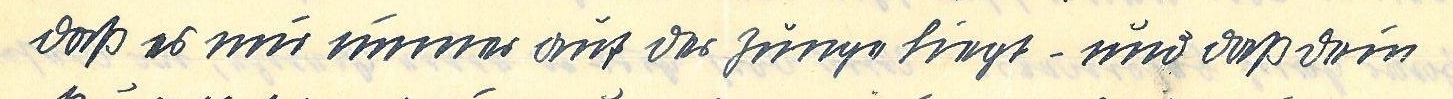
daß es mir immer auf der Zunge liegt und daß Dein
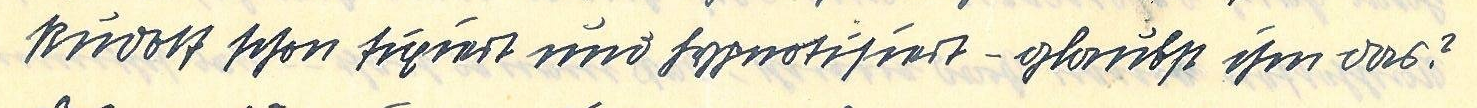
Rudolf schon fixiert und hypnotisiert – glaubst ihm das?
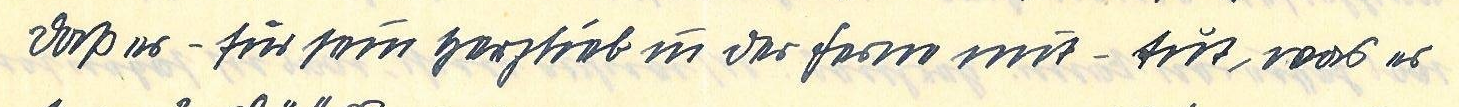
Daß er – für sein Herzlieb in der Ferne mit – tut, was er
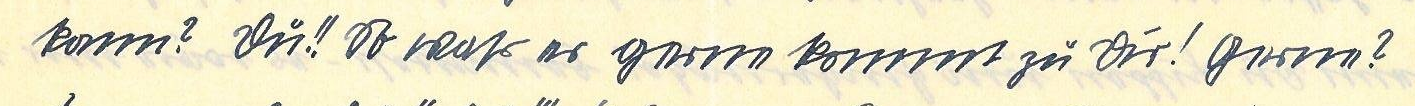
kann? Du!! So wahr er gerne kommt zu Dir! Gerne?
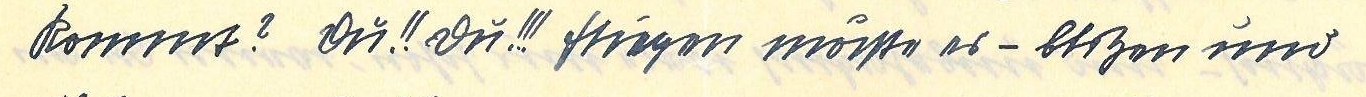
Kommt? Du!! Du!!! Fliegen möchte er – blitzen und
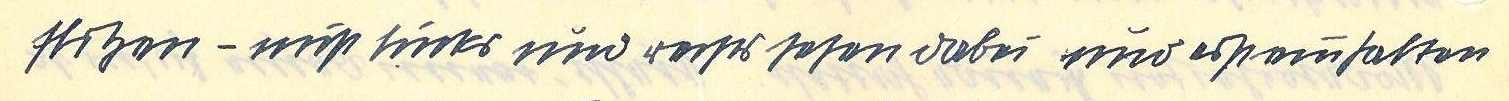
flitzen – nicht links und rechts sehen dabei und erst einhalten
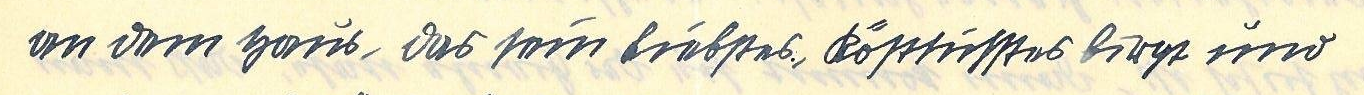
an dem Haus, das sein Liebstes, Köstlichstes birgt und
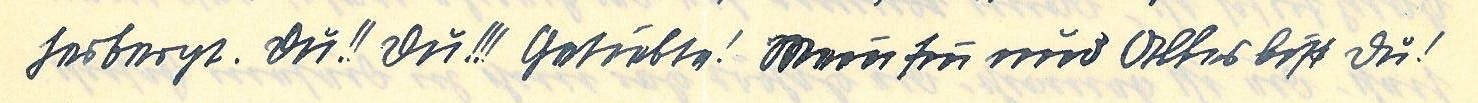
herbergt. Du!! Du!!! Geliebte! Mein Ein und Alles bist Du!
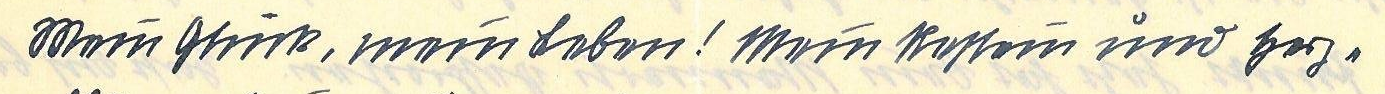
Mein Glück, mein Leben! Mein Rehlein und Herz¬
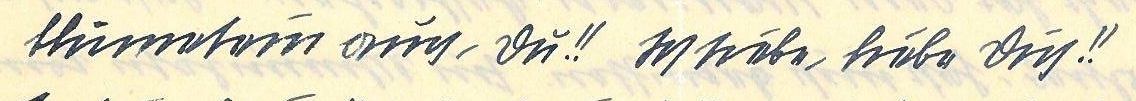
blümelein auch, Du!! Ich liebe, liebe Dich!!
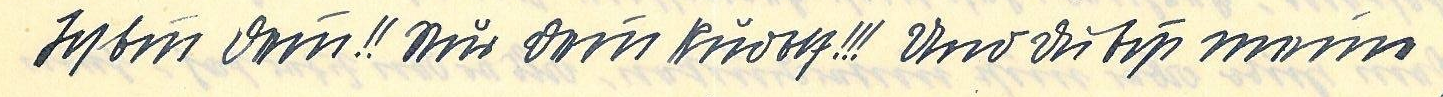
Ich bin Dein!! Nur Dein !!! Und Du bist meine
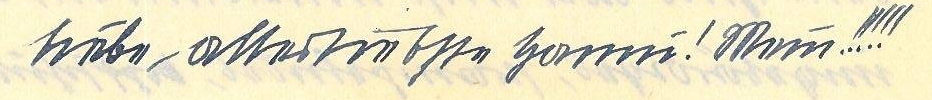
liebe, allerliebste ! Mein!!!!!
